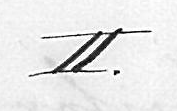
II.
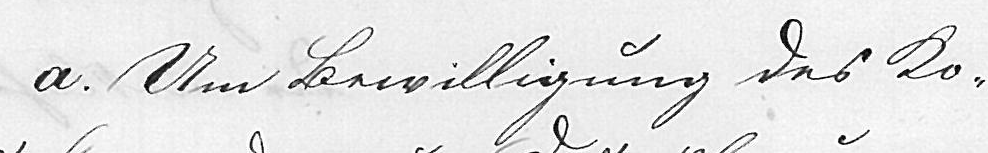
a. Um Bewilligung des Ko-
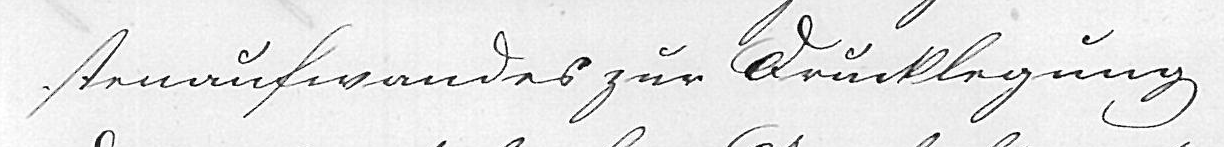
stenaufwandes zur Drucklegung
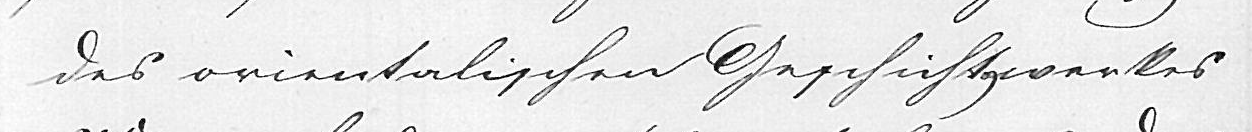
des orientalischen Geschichtswerkes
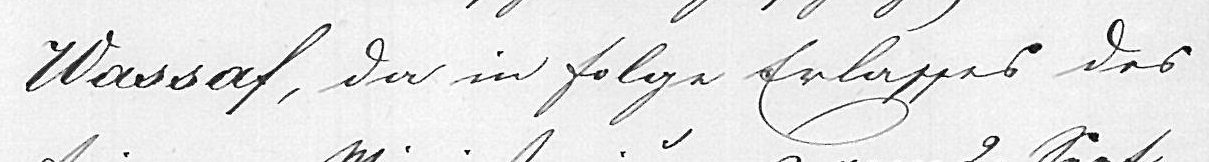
Wassaf, da in Folge Erlasses des
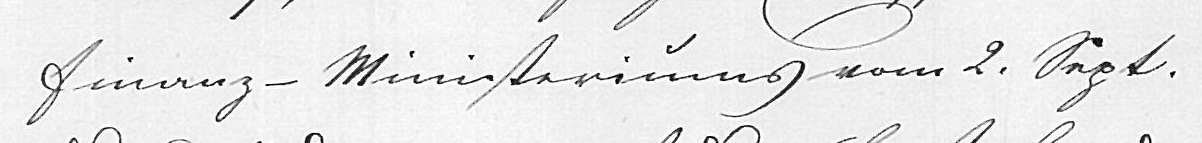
Finanz-Ministeriums vom 2. Sept.
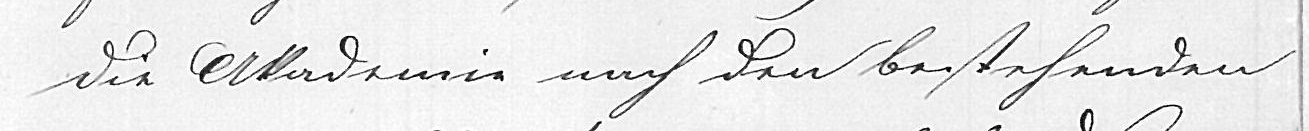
die Akademie nach den bestehenden
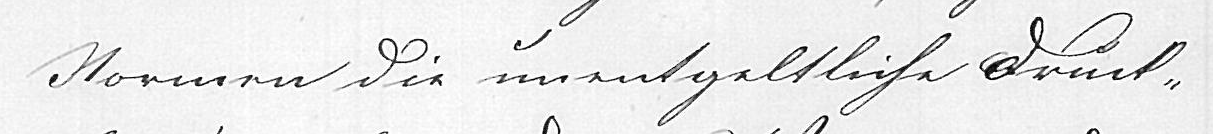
Normen die unentgeltliche Druck-
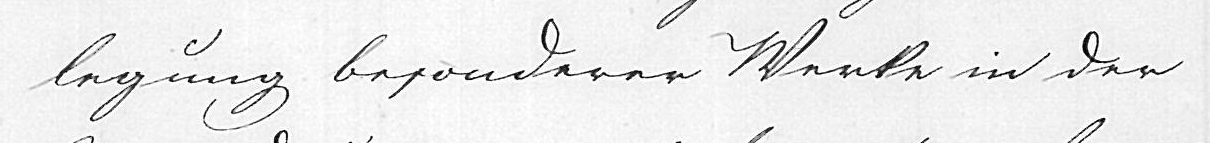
legung besonderer Werke in der
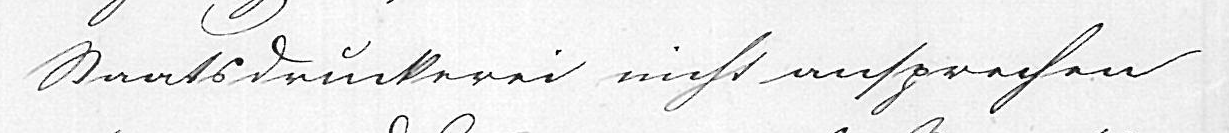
Staatsdruckerei nicht ansprechen
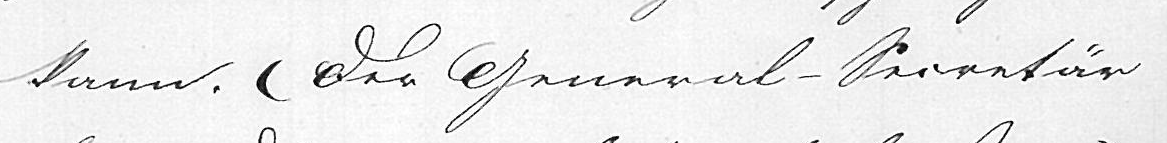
kann. (Der General-Secretär
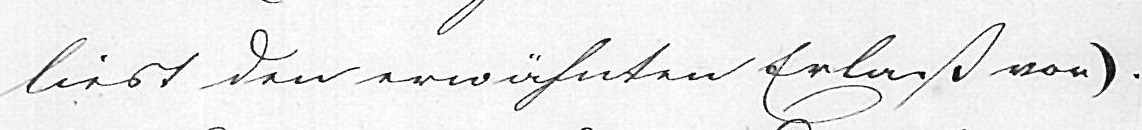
liest den erwähnten Erlaß vor).
